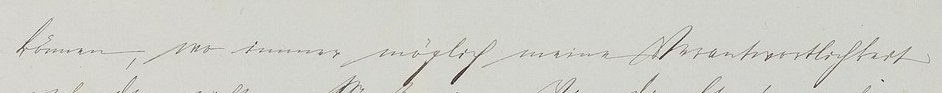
können, wo immer möglich meine Verantwortlichkeit
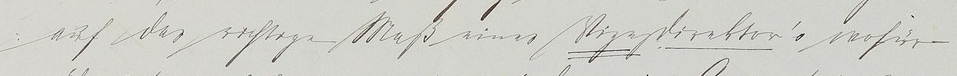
auf das richtige Maß eines VizeDirektor 's wofür
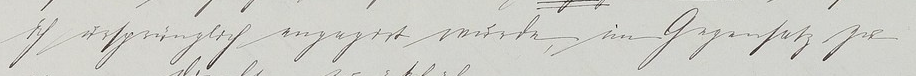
ich ursprünglich engagirt wurde, im Gegensatz zu
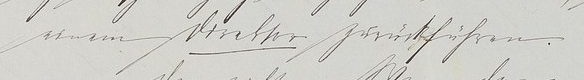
einem Direktor zurückzuführen.
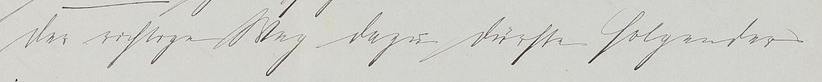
Der richtige Weg dazu dürfte folgender
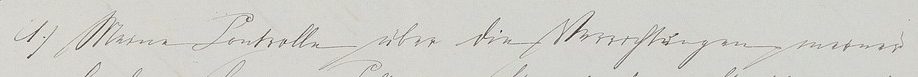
1.) Meine Controlle über die Verrichtungen meiner
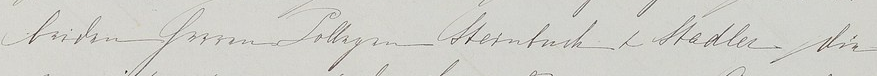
beiden Herren Collegen Steinbuck & Stadler die
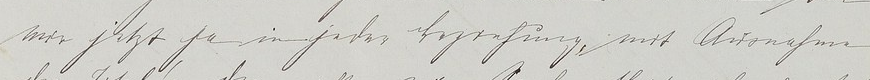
mir jetzt ja in jeder Beziehung, mit Ausnahme
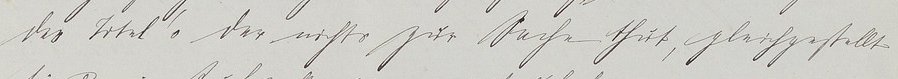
des Titel's der nichts zur Sache thut, gleichgestellt
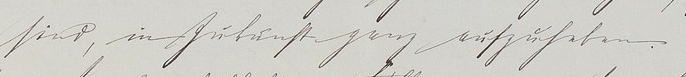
sind, in Zukunft ganz aufzuheben.
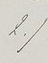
2.)
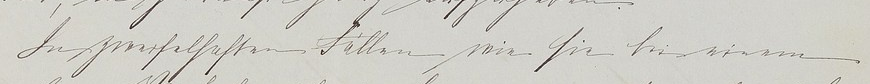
In zweifelhaften Fällen wie sie bei einem
